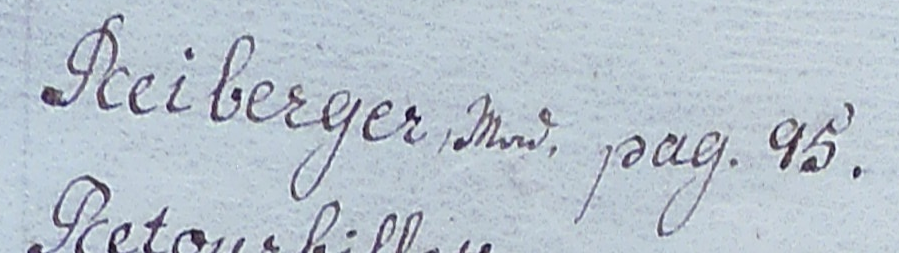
Reiberger, Mad. pag. 95.
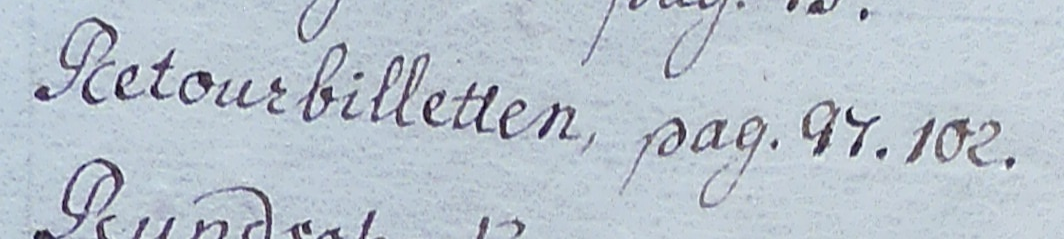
Retourbilletten, pag. 97. 102.
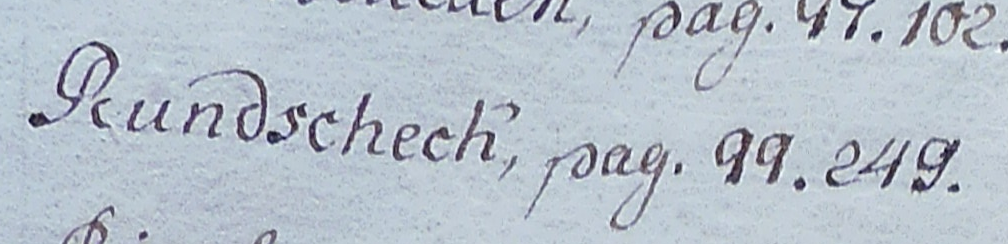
Rundscheck, pag. 99. 249.
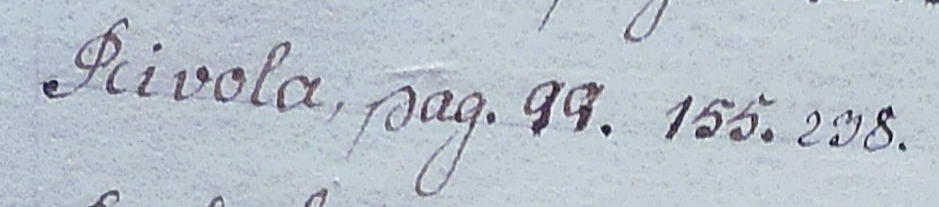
Rivola, pag. 99. 155. 238.
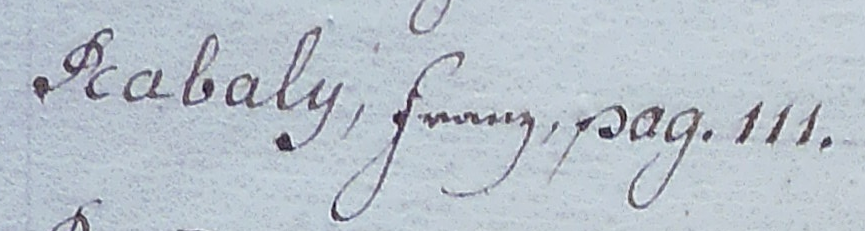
Rabaly, Franz, pag. 111.
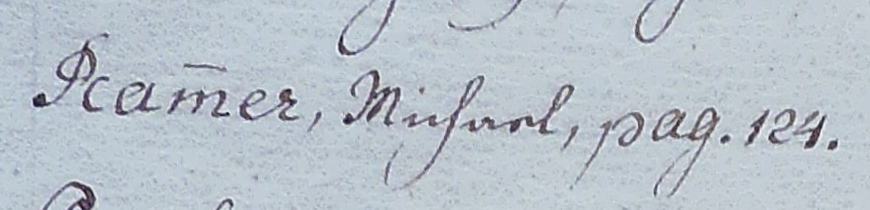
Ram̅er, Michael, pag. 124.
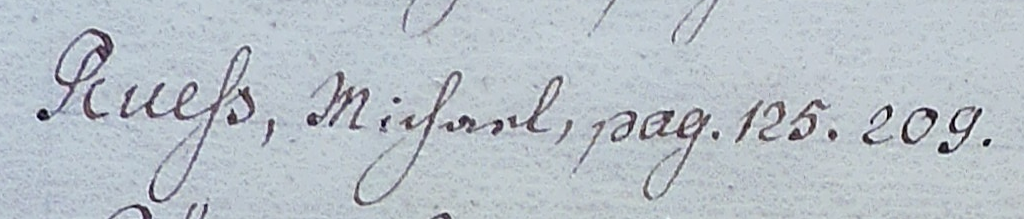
Ruess, Michael, pag. 125. 209.
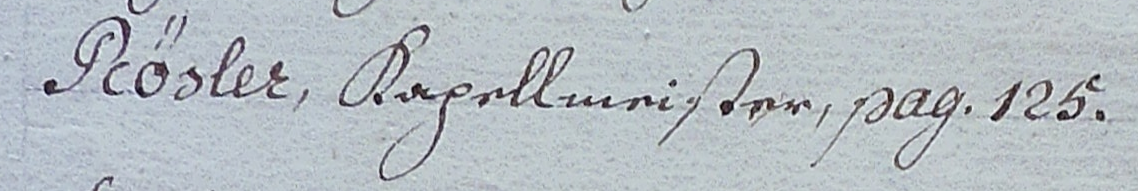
Rösler, Kapellmeister, pag. 125.
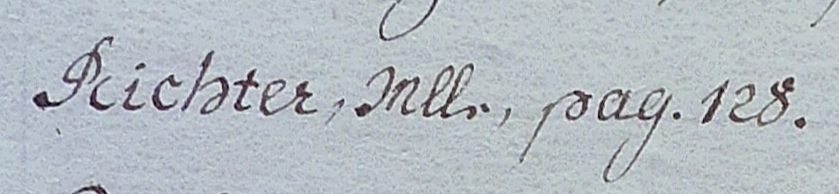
Richter, Mlle, pag. 128.
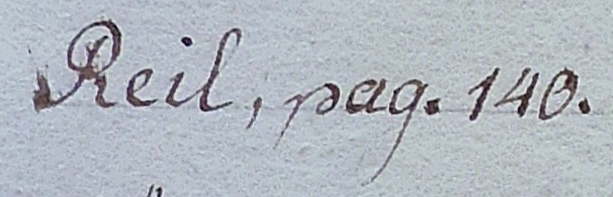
Reil, pag. 140.
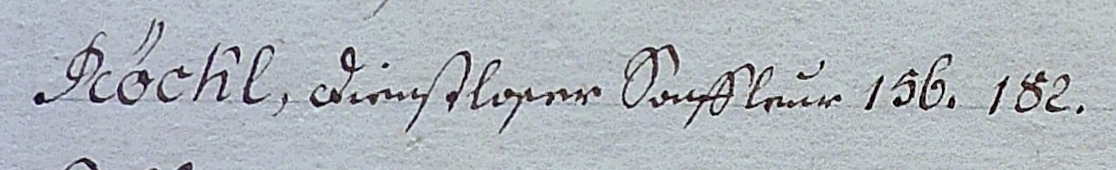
Röckl, Dienstloser Souffleur 156. 182.
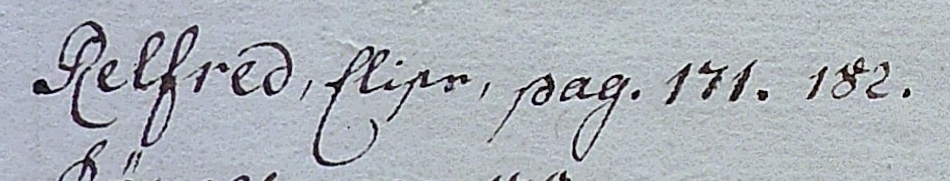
Relfred, Elise, pag. 171. 182.
